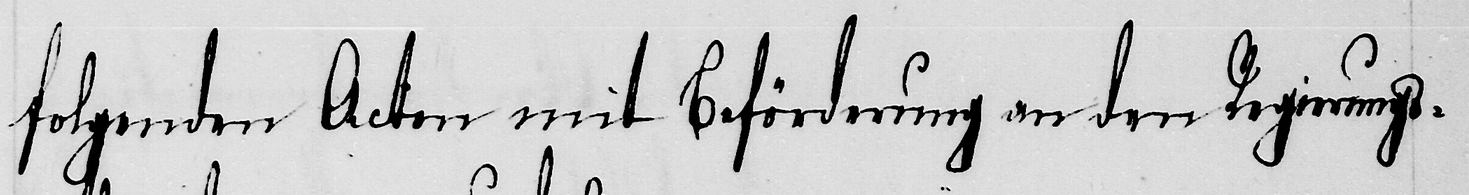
folgenden Acten mit Beförderung an den Regierung¬
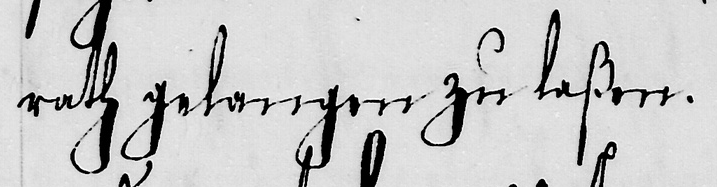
srath gelangen zu laßen.
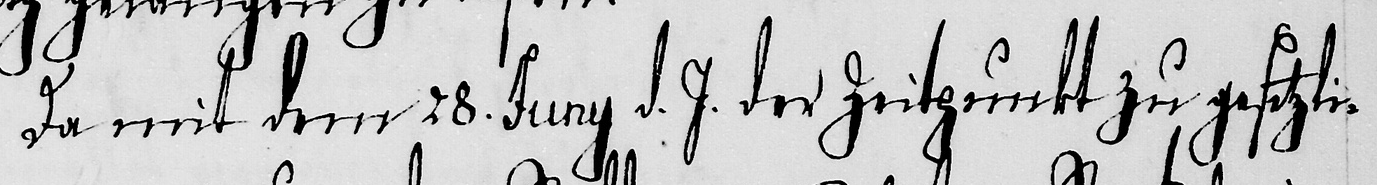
Da mit dem 28. Juny d. J. der Zeitpunkt zu gesetzli¬
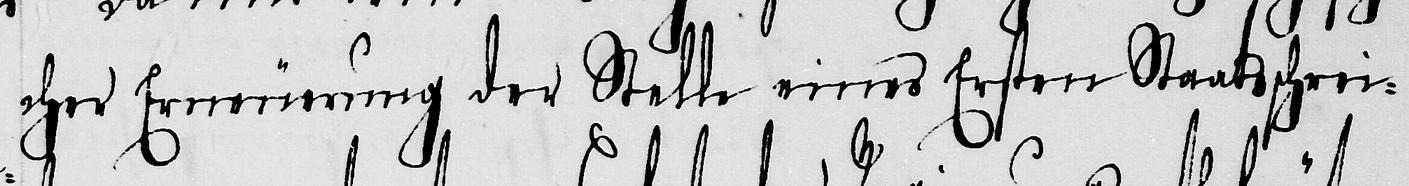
cher Erneuerung der Stelle eines Ersten Staatsschrei¬
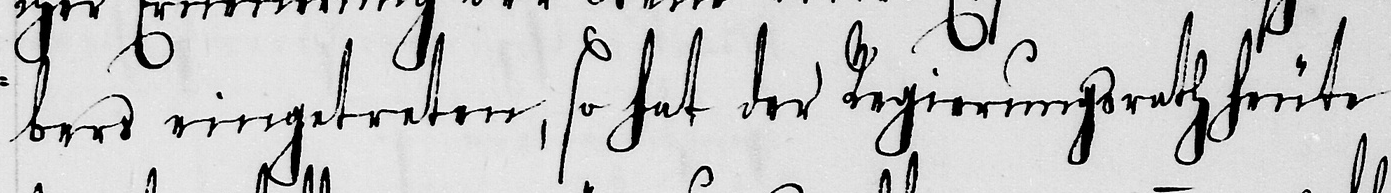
bers eingetreten, so hat der Regierungsrath heute
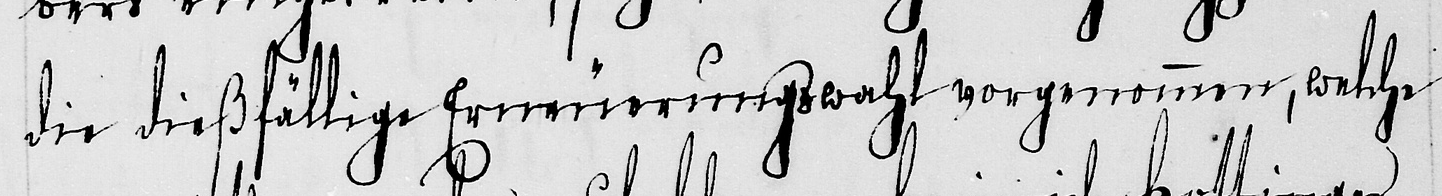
die dießfällige Erneuerungswahl vorgenommen, welche
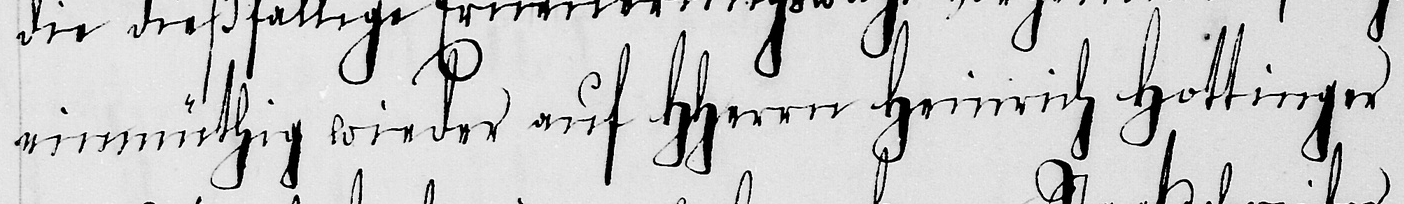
einmüthig wieder auf HHerrn Heinrich Hottinger
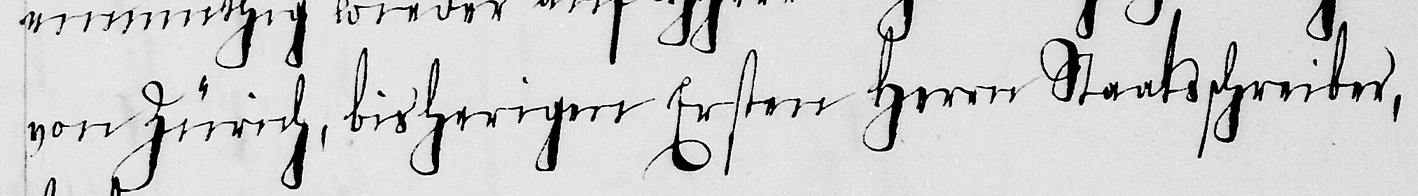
von Zürich, bisherigen Ersten Herrn Staatsschreiber,
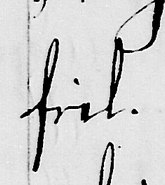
fiel.
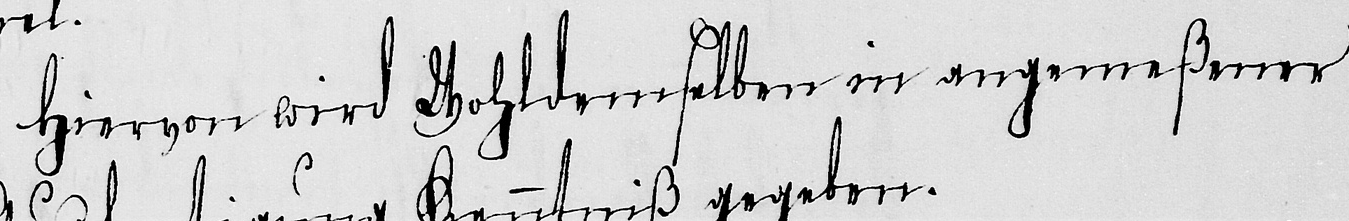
Hiervon wird Wohldemselben in angemeßener
